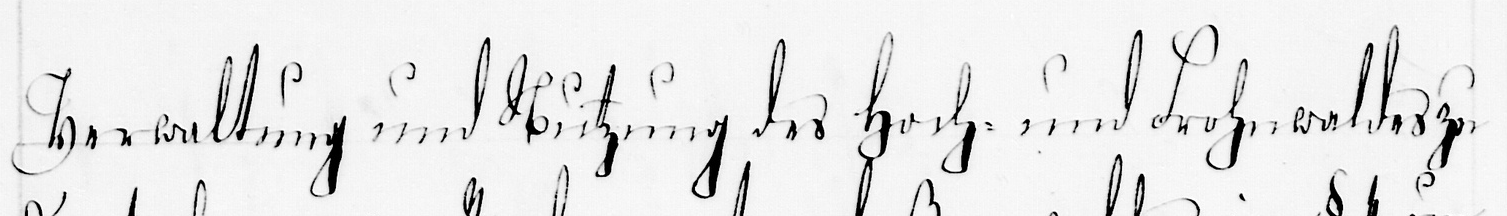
Verwaltung und Nutzung des Hoch- und Frohnwaldes zu
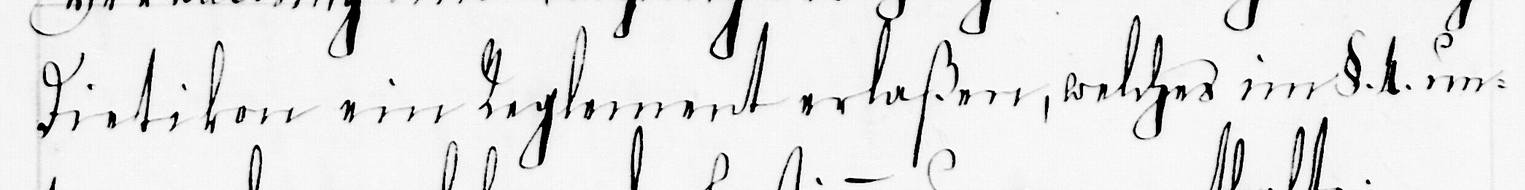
Dietikon ein Reglement erlaßen, welches im §. 4. un¬
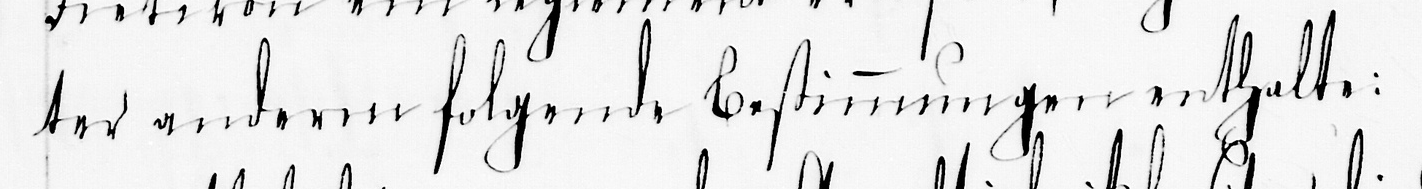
ter anderm folgende Bestimmungen enthalte:
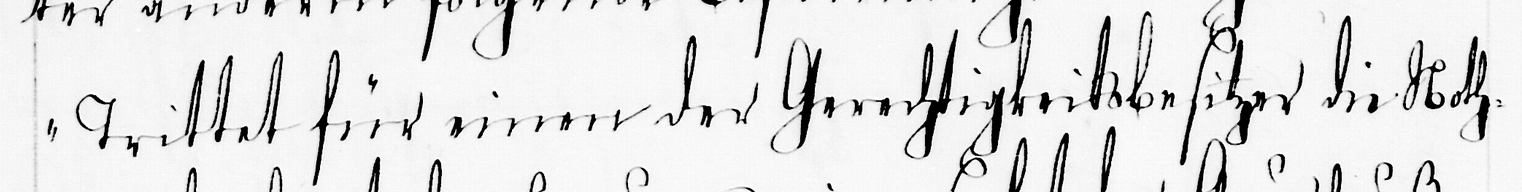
„Trittet für einen der Gerechtigkeitsbesitzer die Noth¬
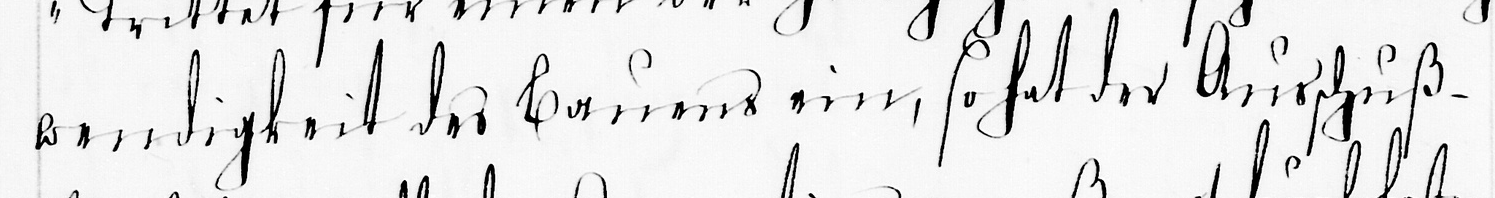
wendigkeit des Bauens ein, so hat der Ausschuß –
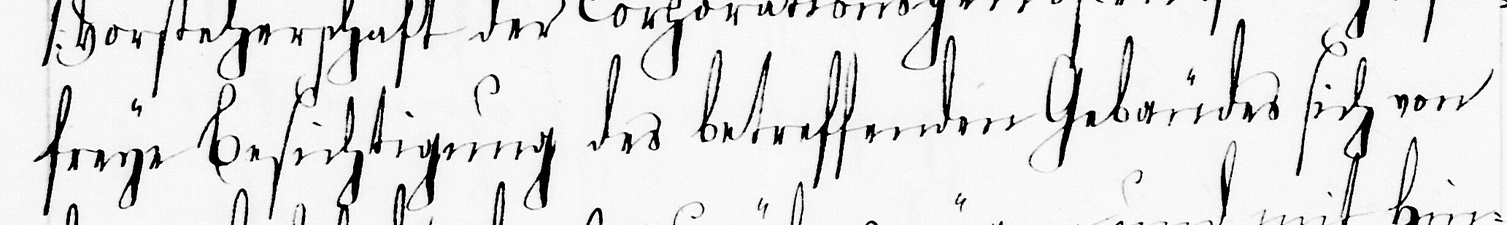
freye Besichtigung des betreffenden Gebäudes sich von
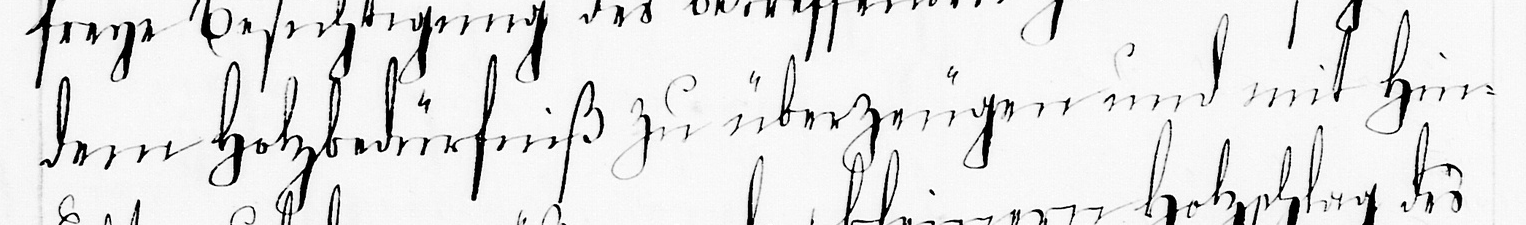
dem Holzbedürfniß zu überzeugen und mit Hin¬
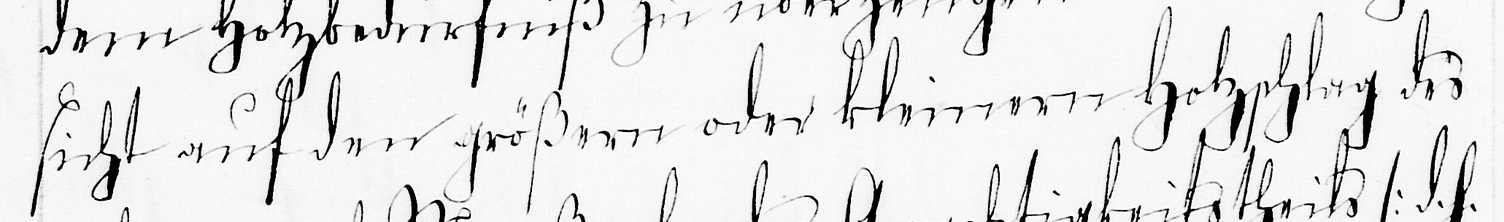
sicht auf den größern oder kleinern Holzschlag des
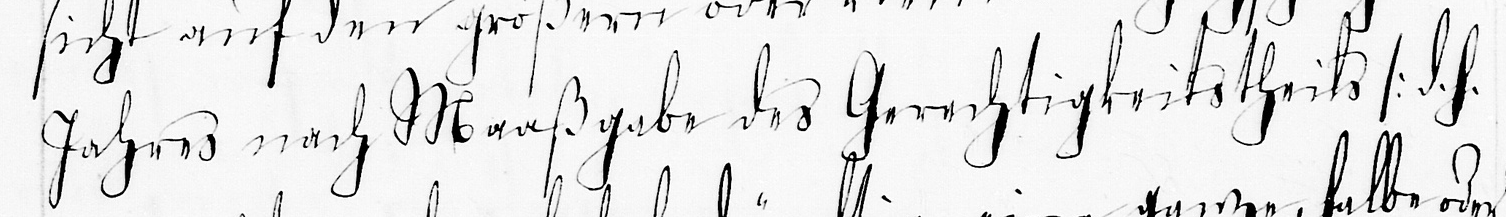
Jahres nach Maaßgabe des Gerechtigkeitstheils [d. h.
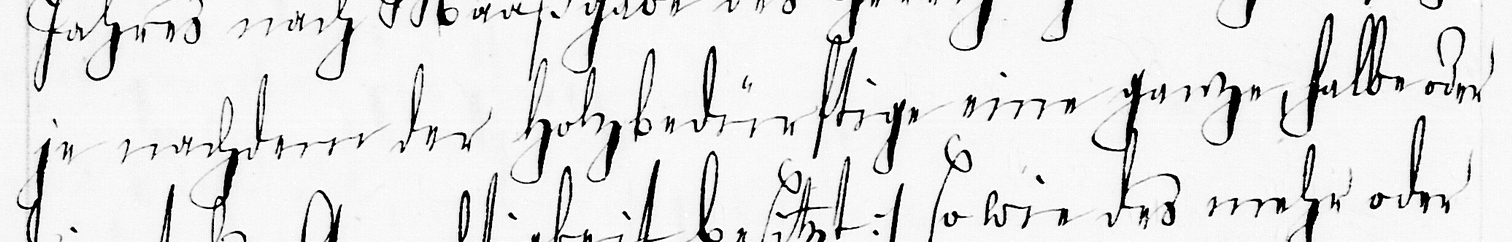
je nachdem der Holzbedürftige eine ganze, halbe oder
